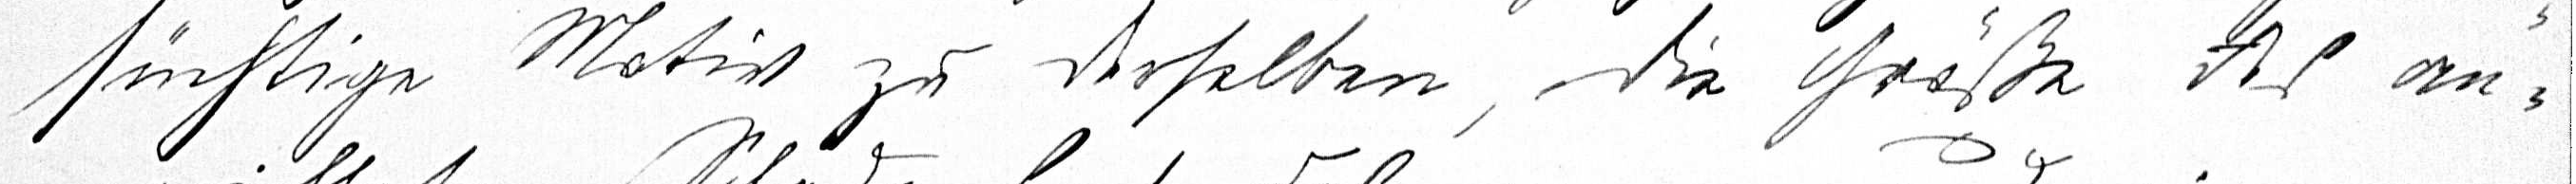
süchtige Motiv zu derselben, die Größe des an¬
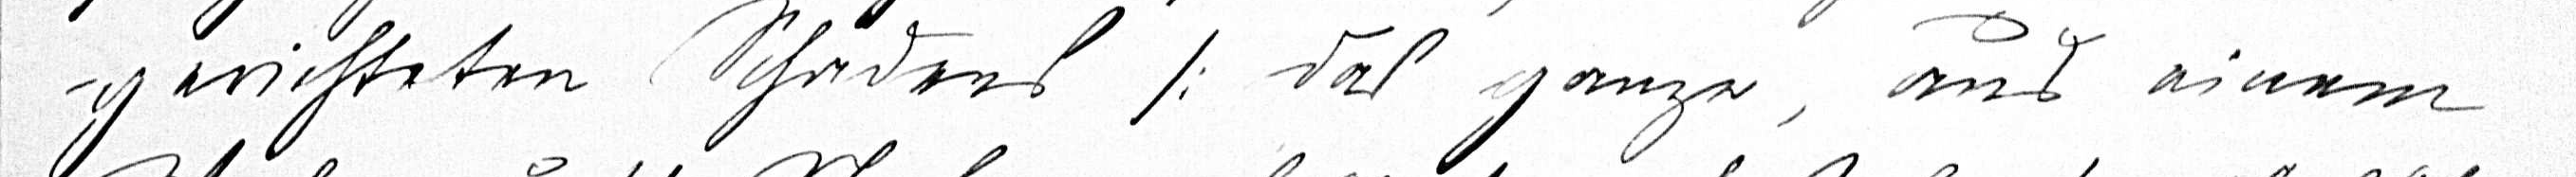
gerichteten Schadens /: das ganze, aus einem
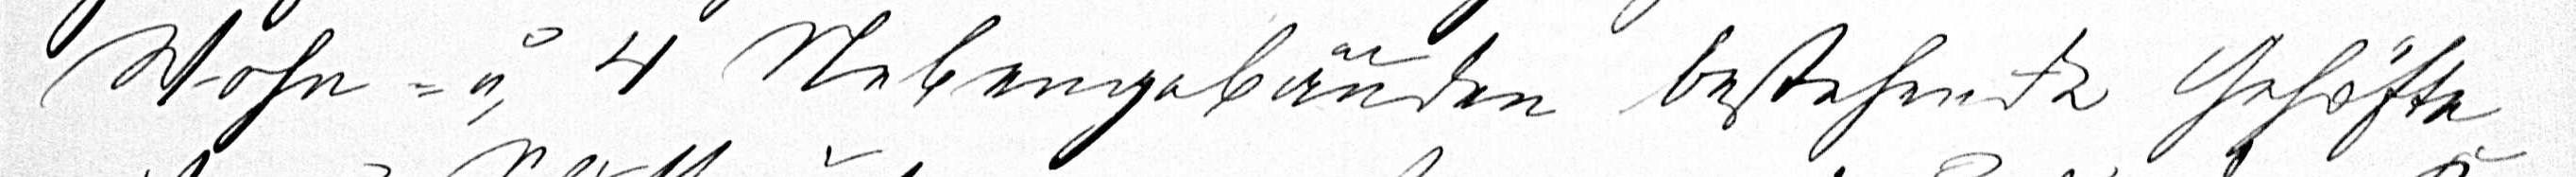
Wohn- u, 4 Nebengebäuden bestehende Gehöfte
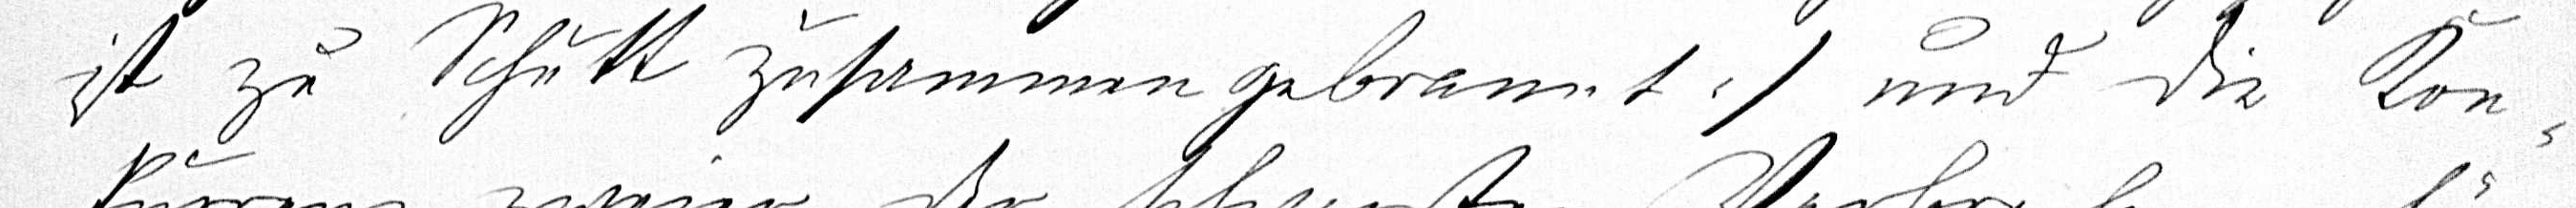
ist zu Schutt zusammen gebrannt :/ und die Kon¬
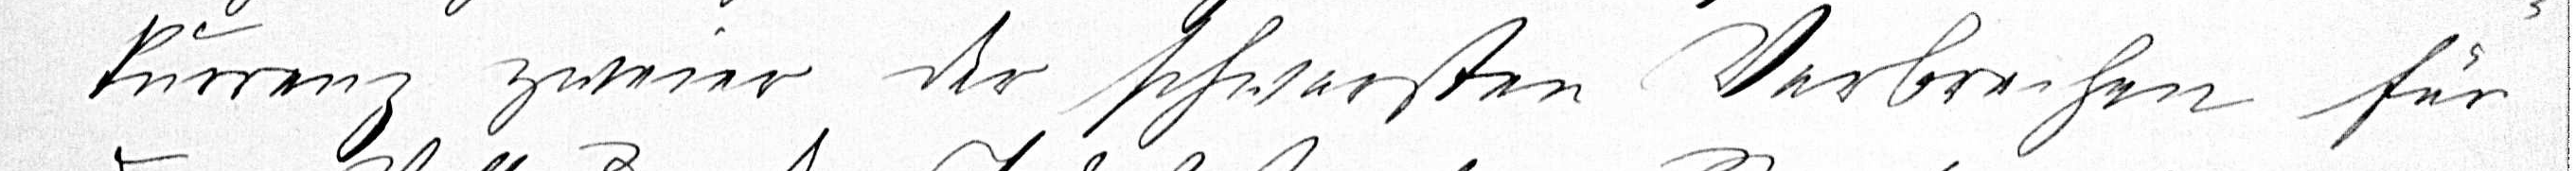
kurrenz zweier der schwersten Verbrechen für
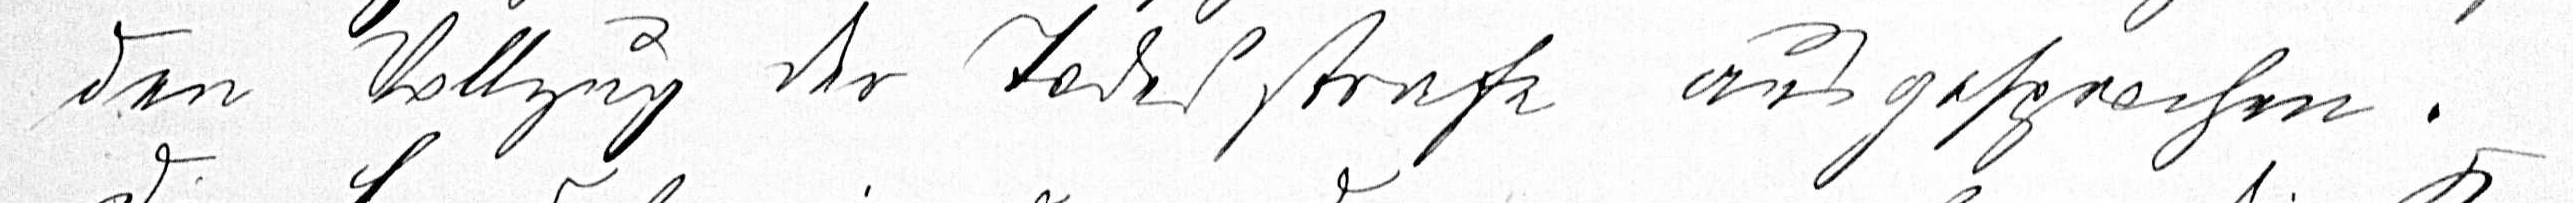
den Vollzug der Todesstrafe ausgesprechen.
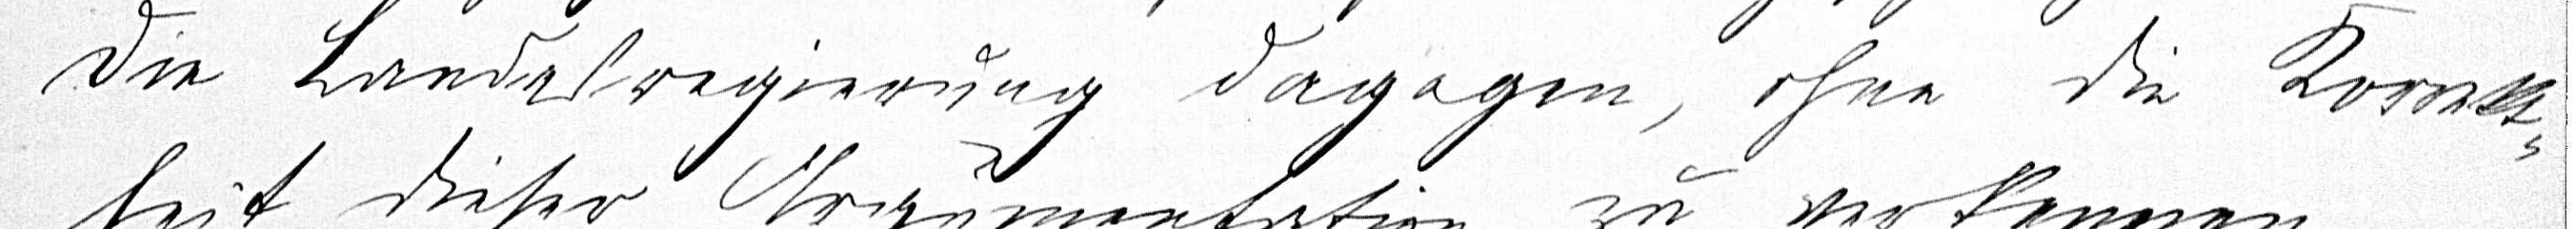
Die Landesregierung dagegen, ohne die Korrekt¬
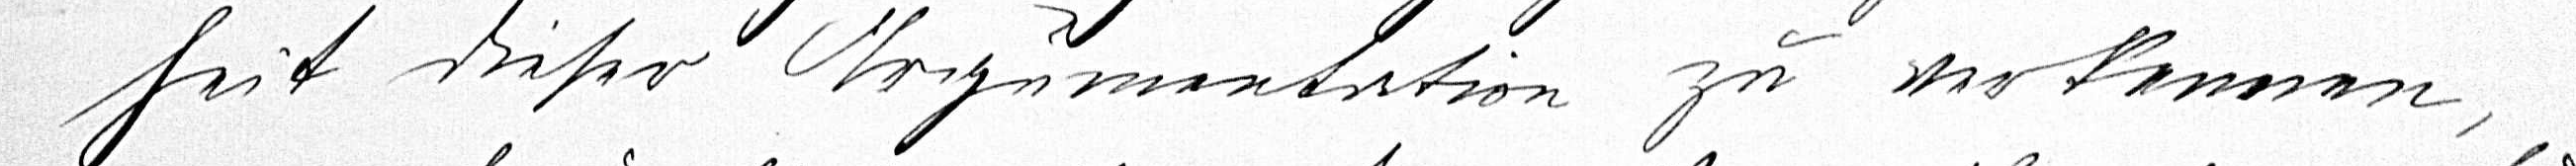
heit diesre Argumentation zu verkennen,
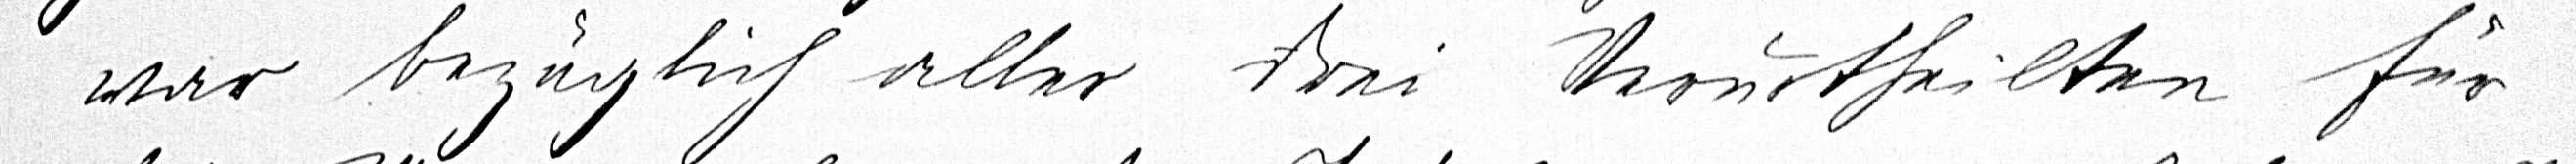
war bezüglich alter drei Verurtheilten für
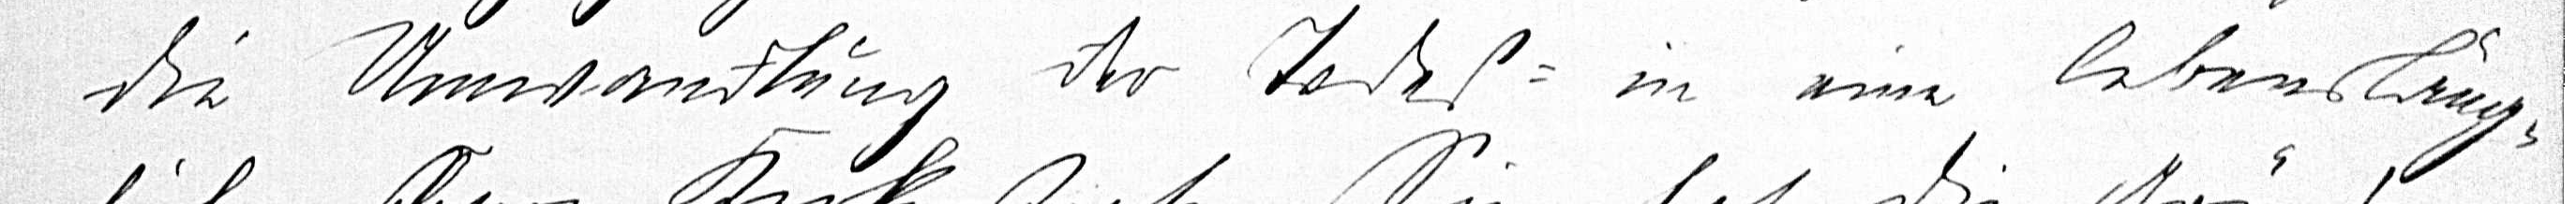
die Umwandlung der Todes- in eine lebensläng¬
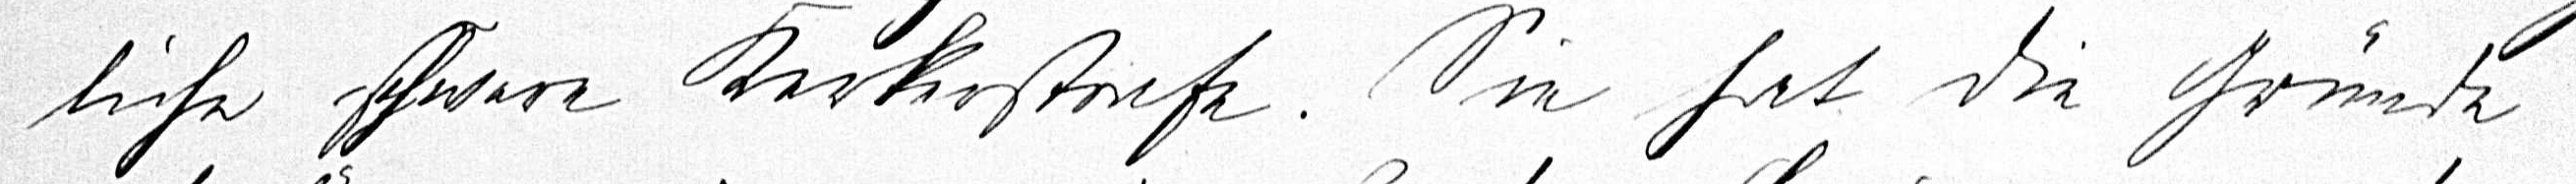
liche schwere Kerkerstrafe. Sie hat die Gründe
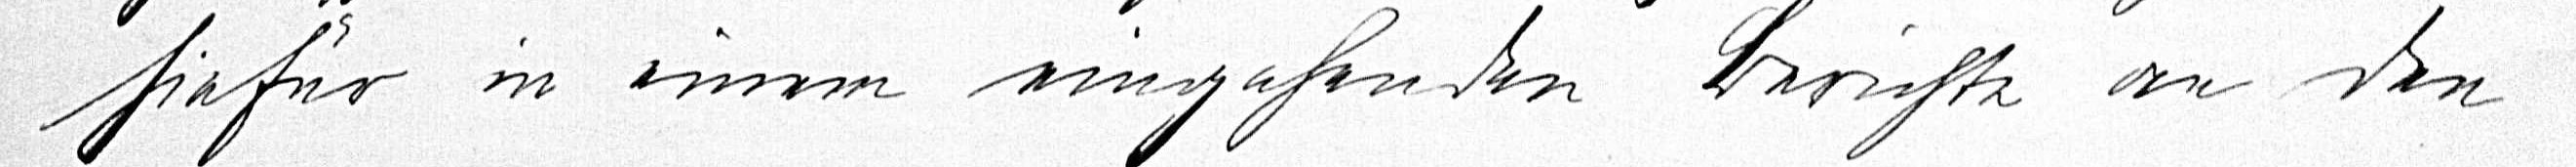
hiefür in einem eingehenden Berichte an den
